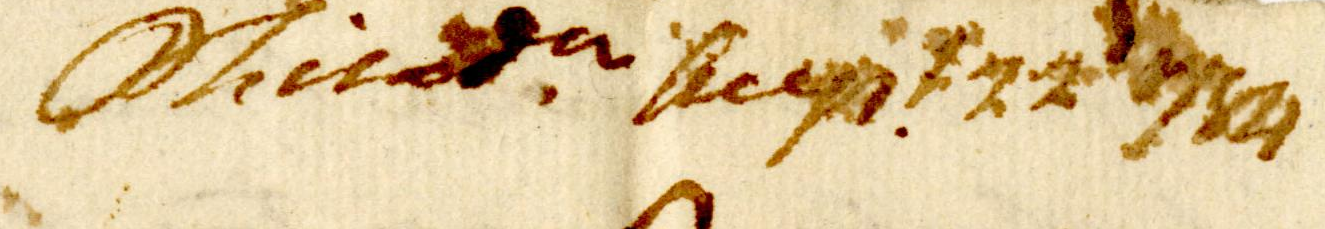Philad^a Aug^t. 22^d 1784
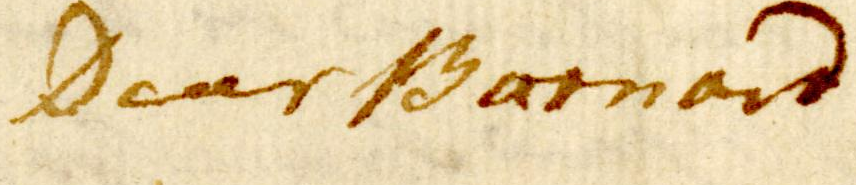Dear Barnard
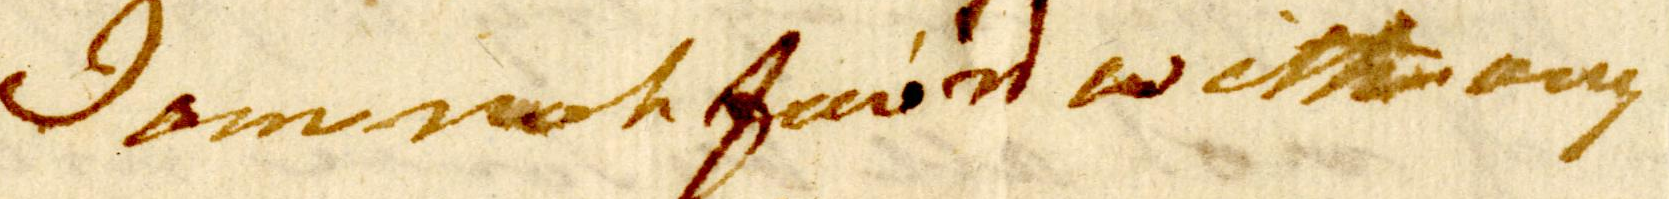I am not fav^rd with any
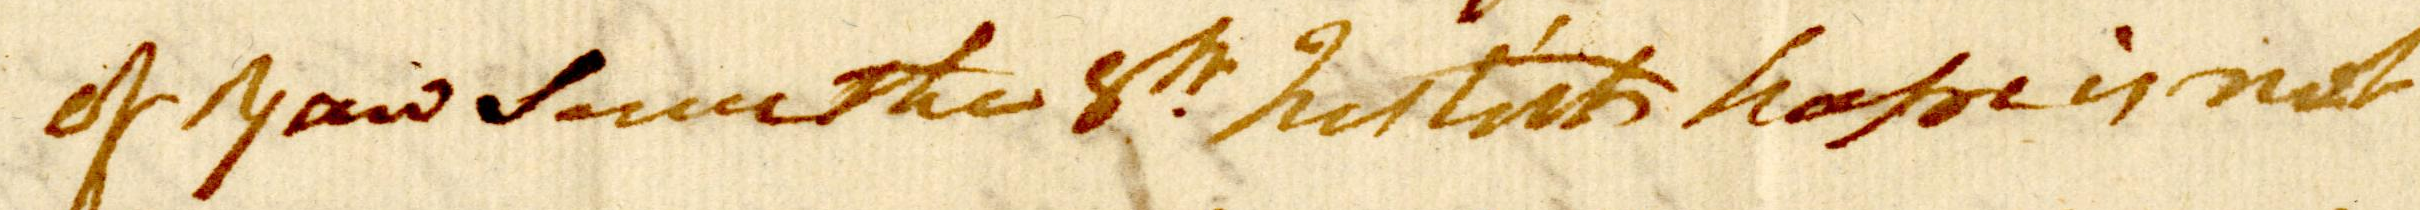of you since the 8^th Inst'nt hope is not
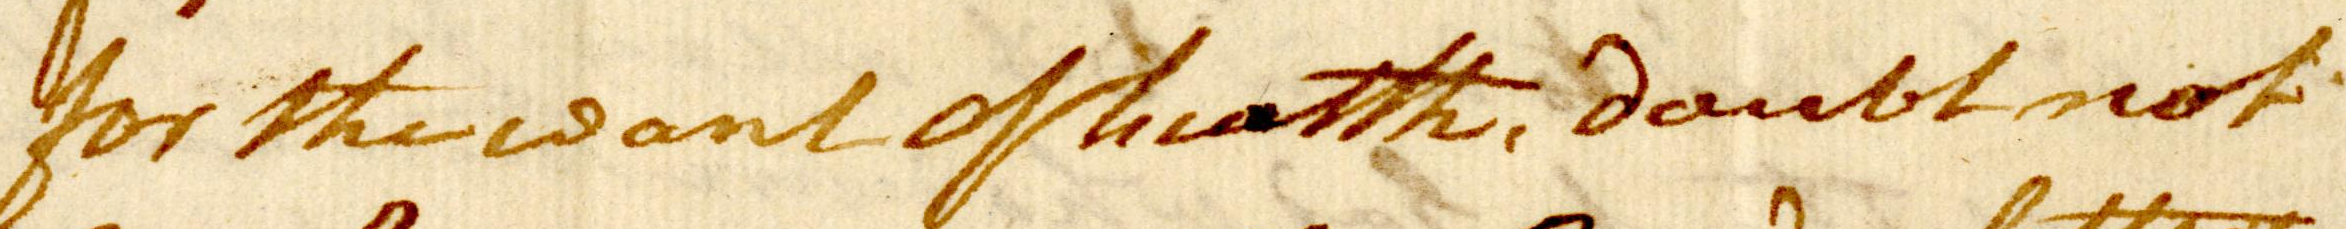for the want of health, doubt not
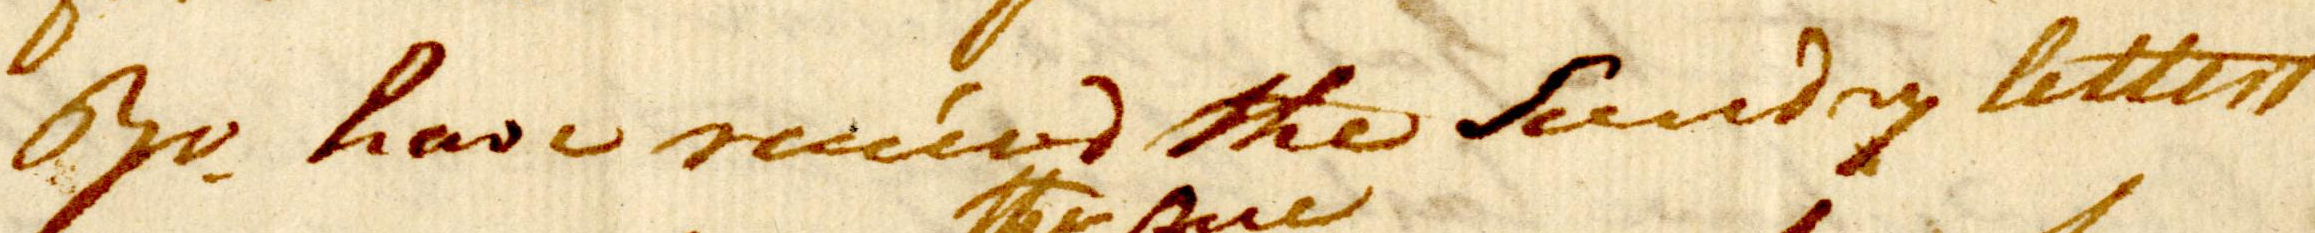yo. have received the sunday letter
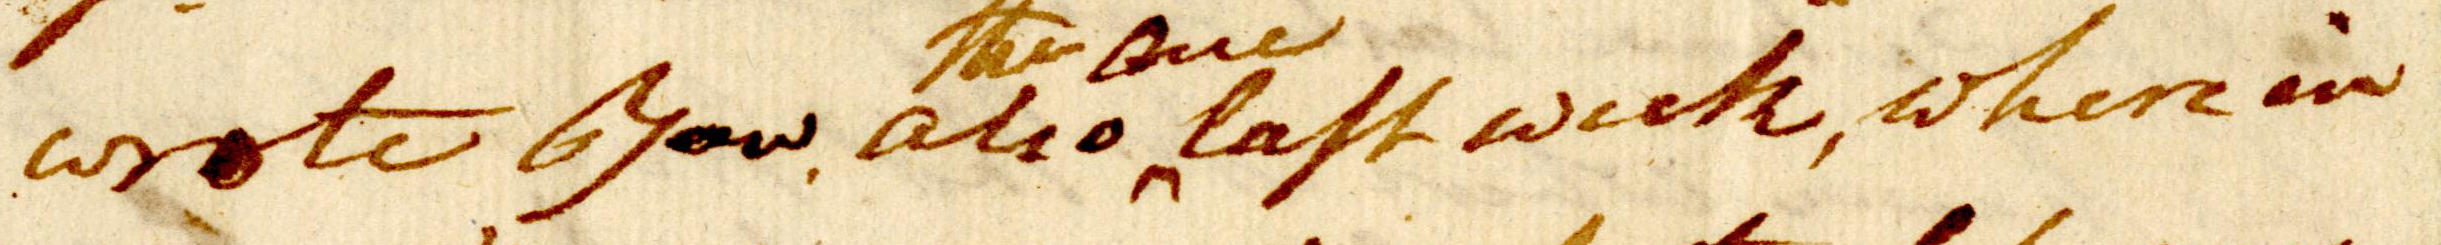wrote you also ^ last week, where in
